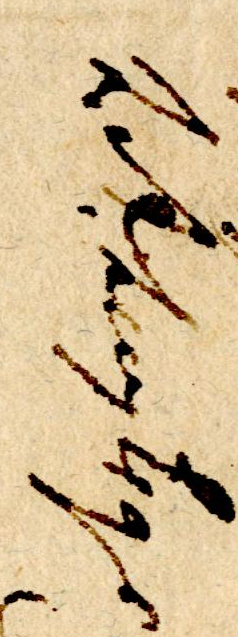L A Levy Esq^r
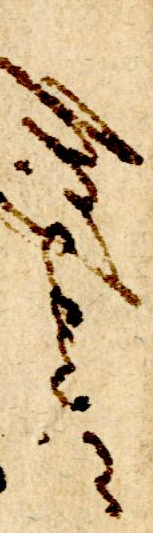p^r. fav^r.
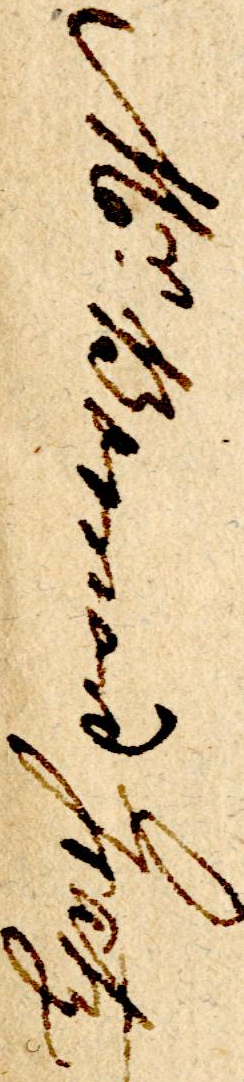M^r Barnard Gratz
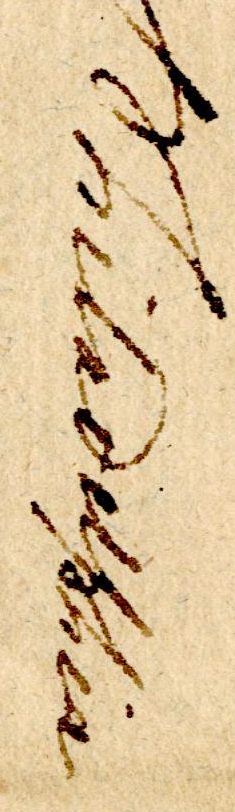Philadelphia
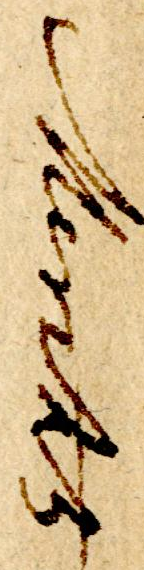Mercht
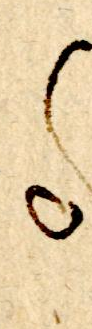To
